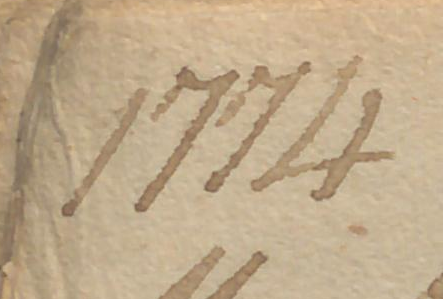1774
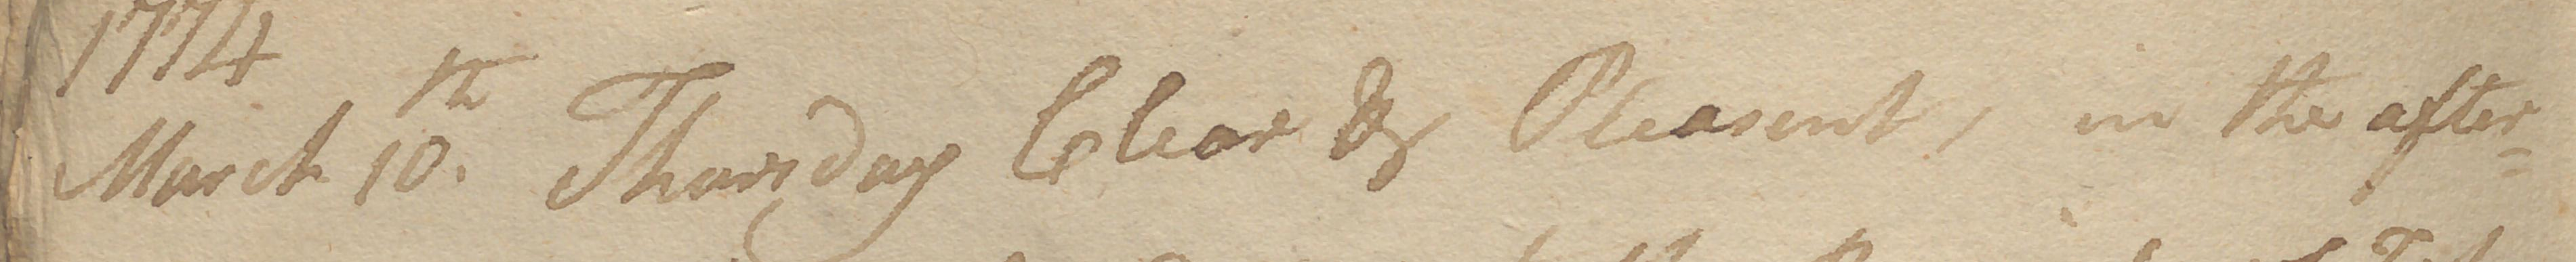March 10^th. Thursday Clear & Pleasent, in the after
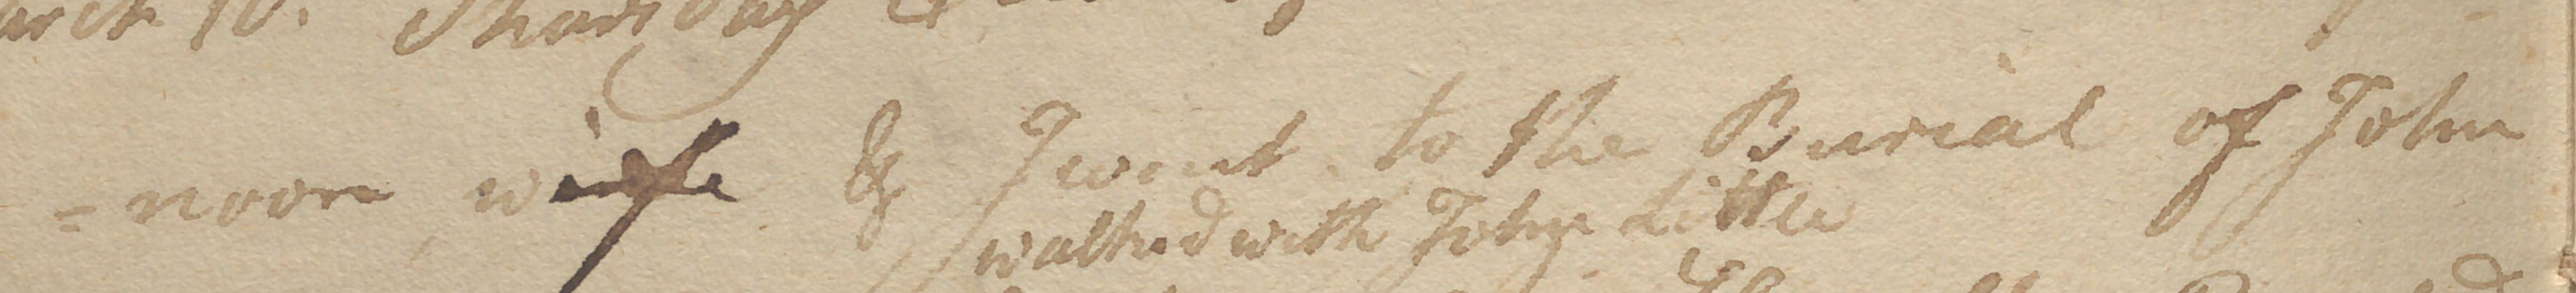-noon wife & I went to the Burial of John
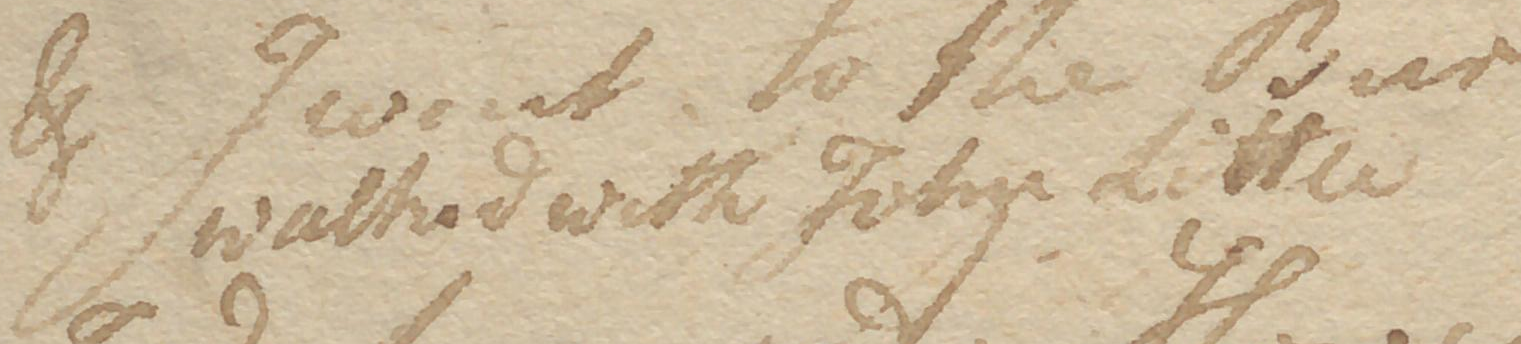walked with John Little
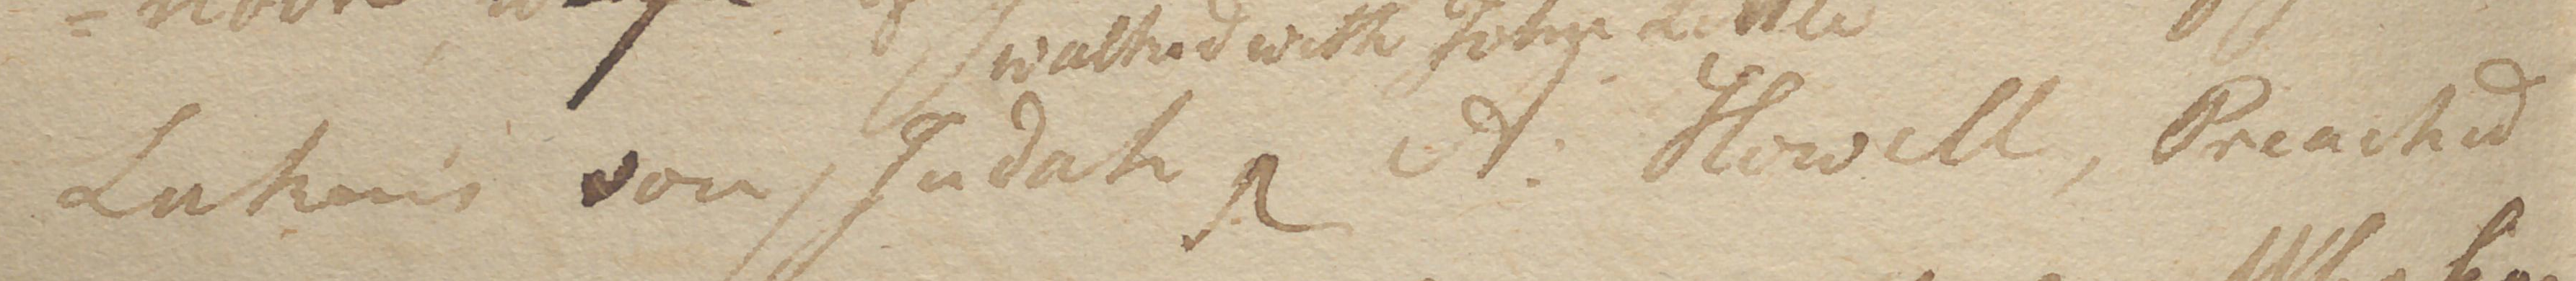Luken's son Judah ^ A. Howell, Preached
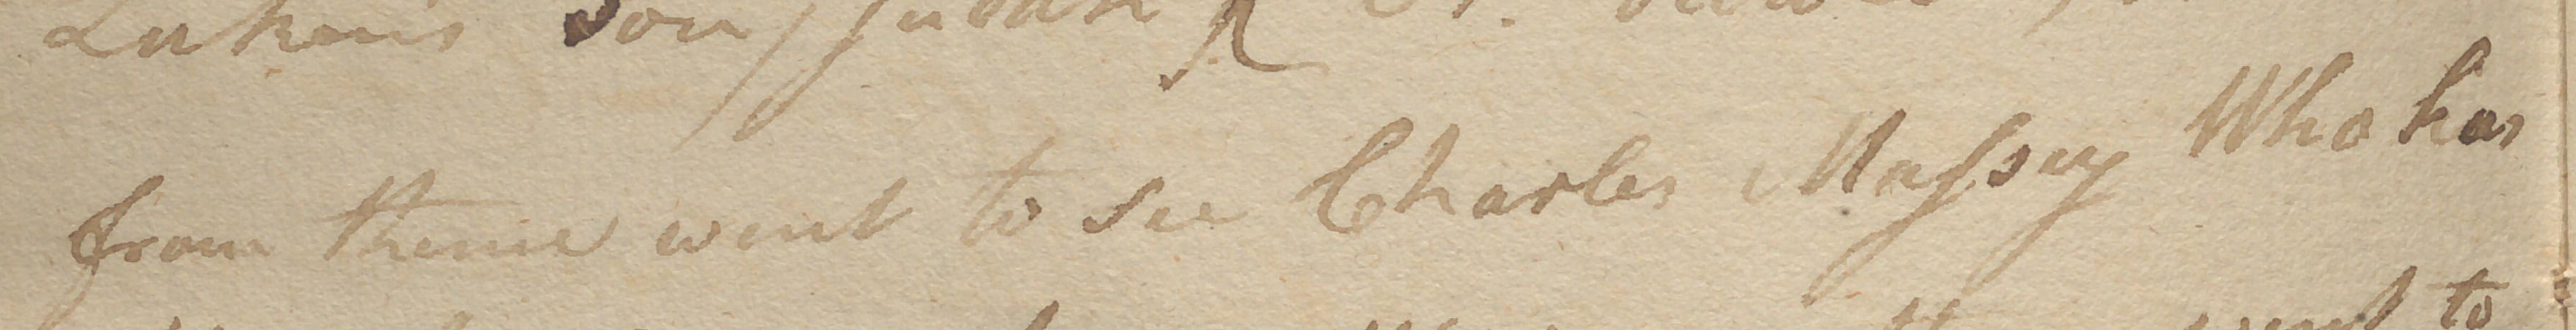from thence went to see Charles Massey Who has
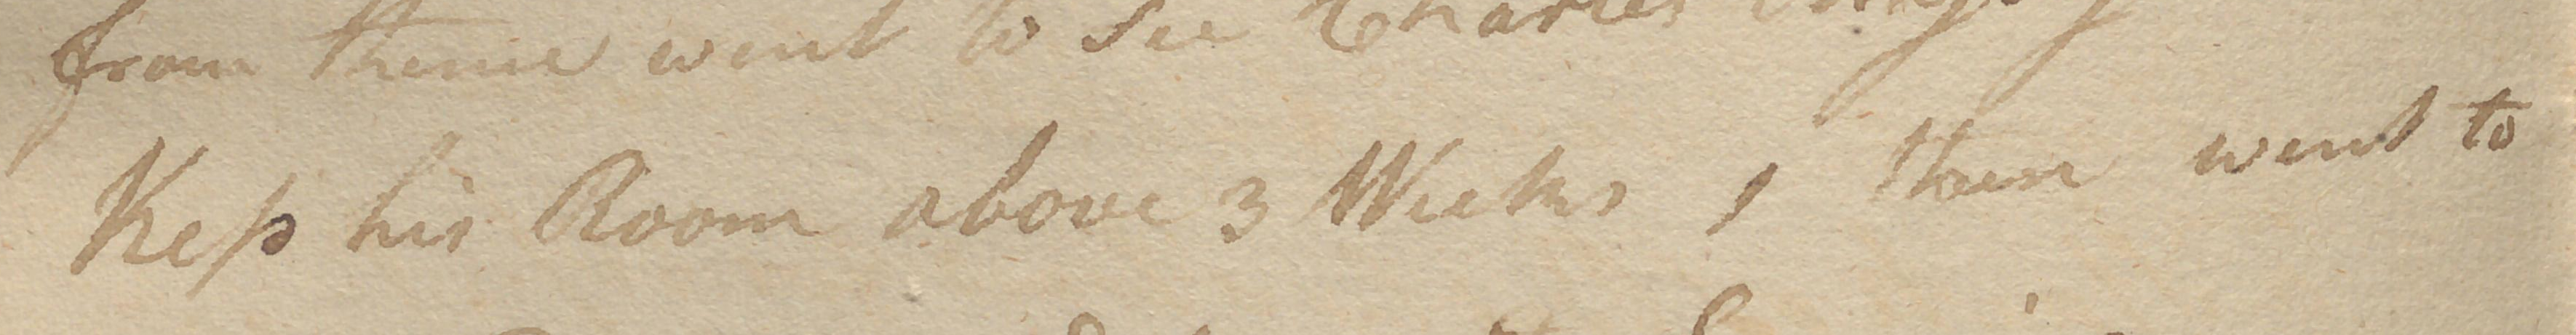Kep his Room above 3 Weeks, then went to
